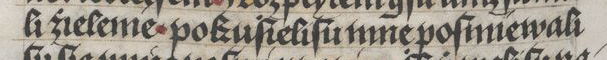li żieleníe.pokuẛieliſu mne poſmíewali
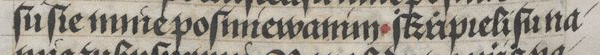ſu ſie mnie poſmíewaním.ẛkṙipieliſu na¬
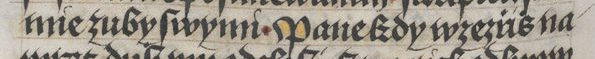mie zuby ſwymi.Pane kdy wzezṙíṡ na¬
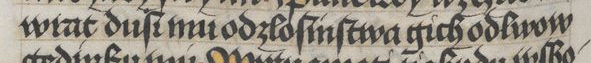wrat duẛi mu odzloſínſtwa gich odlwow
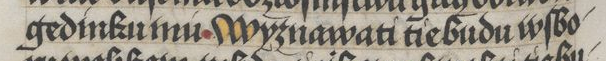gedínku mú.Wyznawati tiebudu wſbo¬
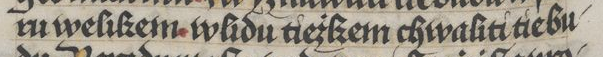ru welikem.wlidu tieżkem chwaliti tiebu¬
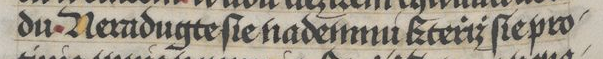du.Neradugte ſie nademnú kteṙiż ſie pro¬
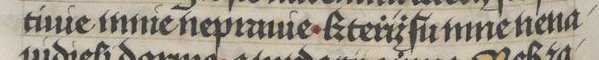tiuie mnie neprauie.kteṙíż ſu mne nena¬
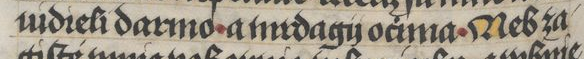uidieli darmo.a mrdagij oċima.Neb za¬
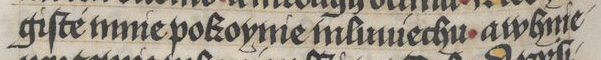giſté mnie pokoynie mluuíechu.a w hnie¬
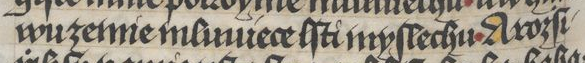wu zemie mluuíece lſti myſlechu.A rozẛi¬
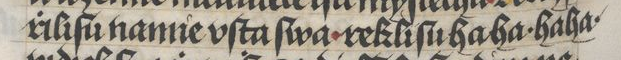ṙiliſu namie vſta ſwa.rekliſu ha ha.haha.¬
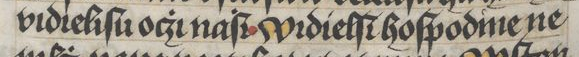vidieliſu ocżi naẛi.Vidíelſi hoſpodine ne
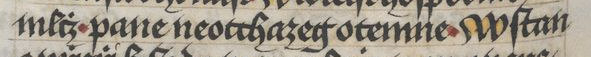mlcż.pane neotchazeg otemne.Wſtan
